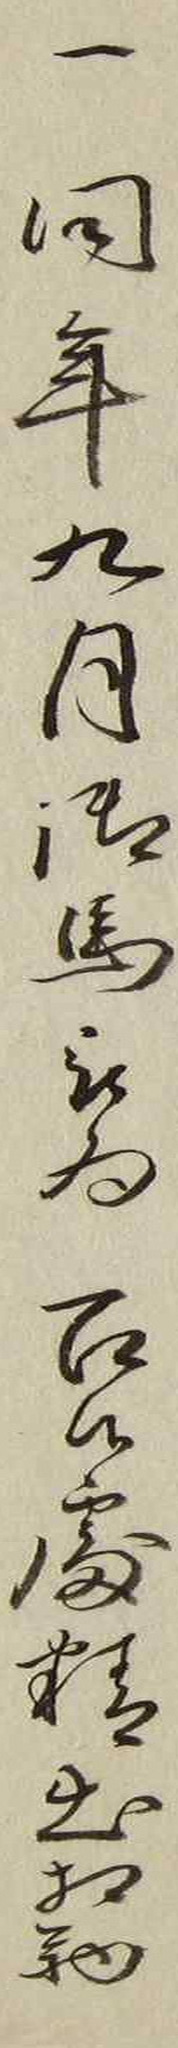一同年九月御馬被為召候処精出相勤
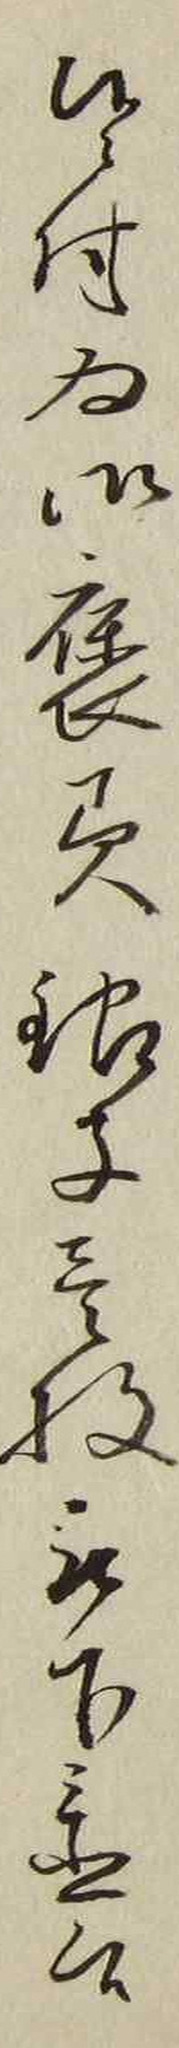候ニ付為御褒美銀子壱枚被下置候

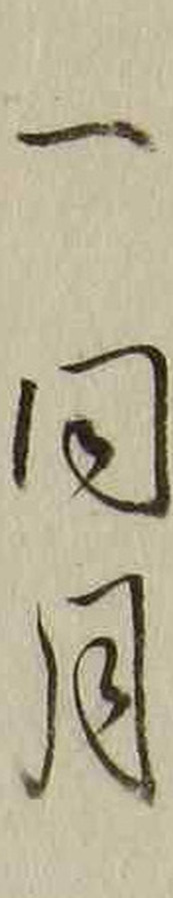一同月
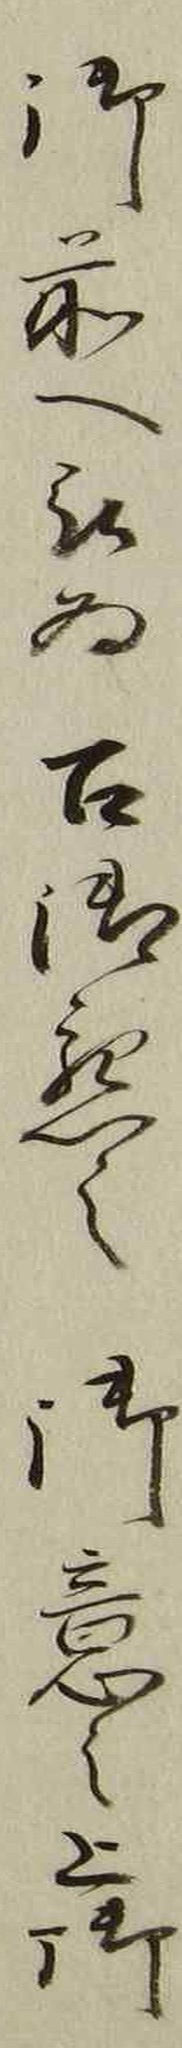御前へ被為召御懇之御意之上御
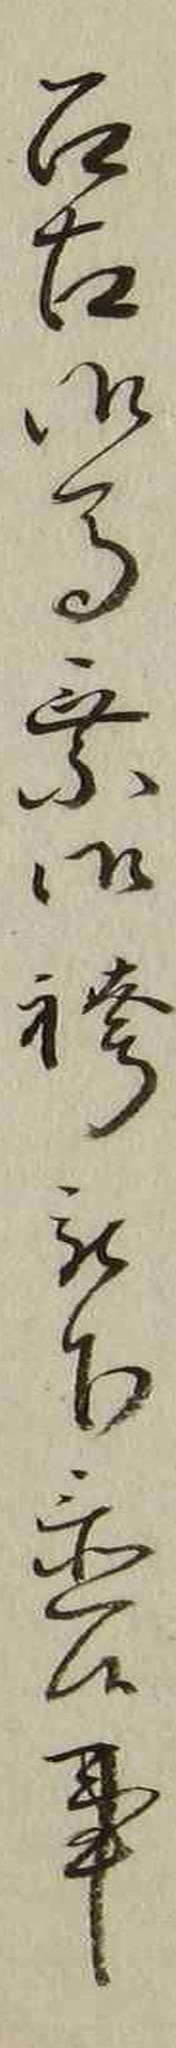召古御馬乗御袴被下置候事
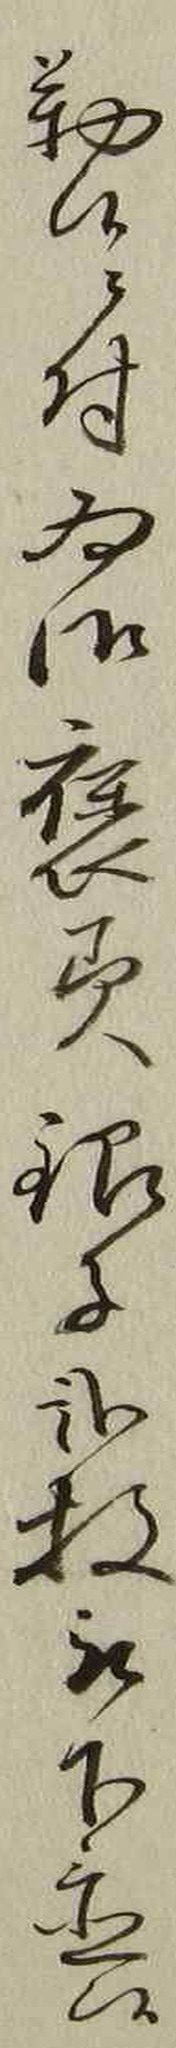勤候ニ付為御褒美銀子弐枚被下置候
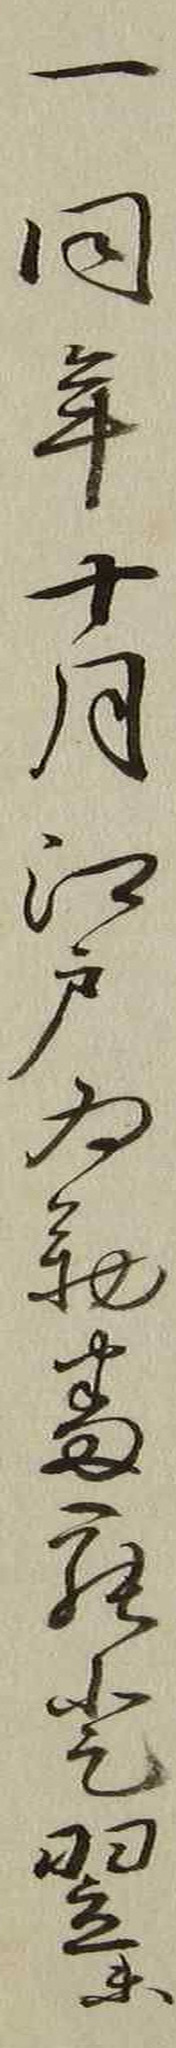一同年十月江戸為勤番罷登翌未
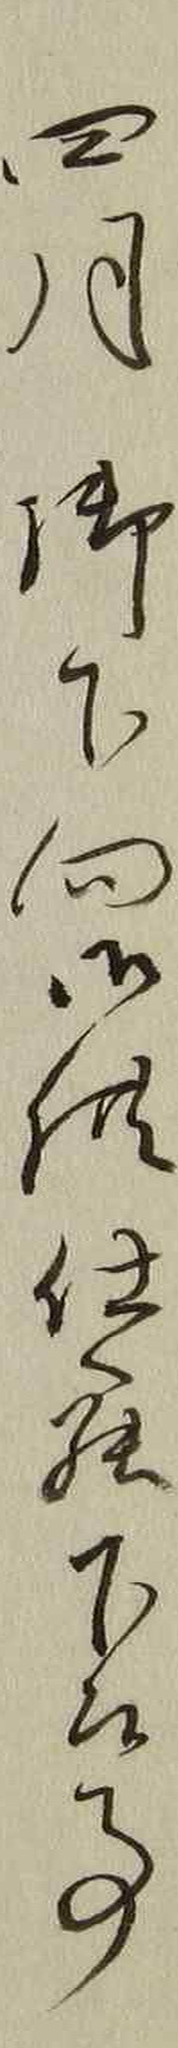四月御下向御供仕罷下候事
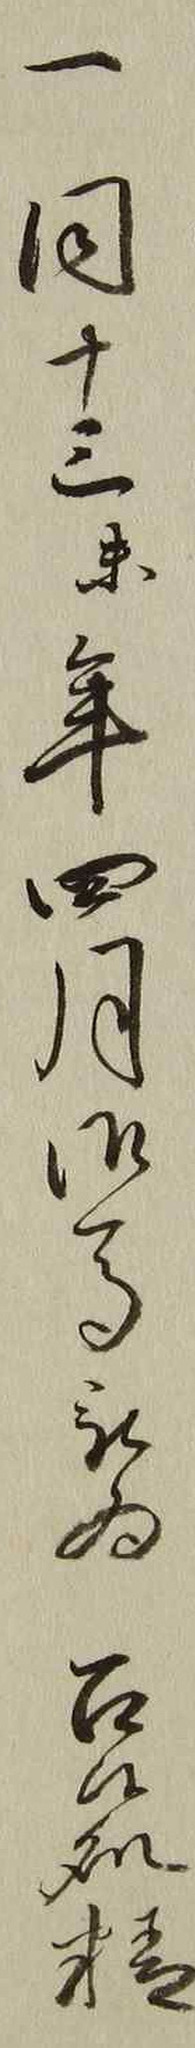一同十三未年四月御馬被為召候処精
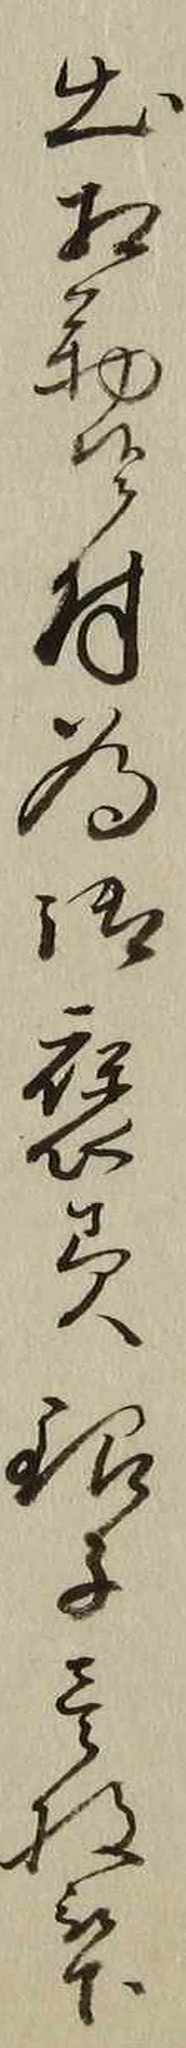出相勤候ニ付為御褒美銀子壱枚被下
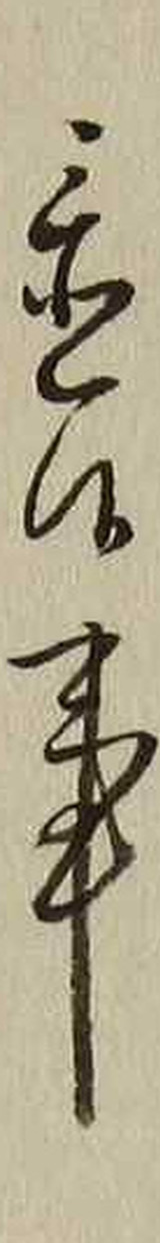置候事
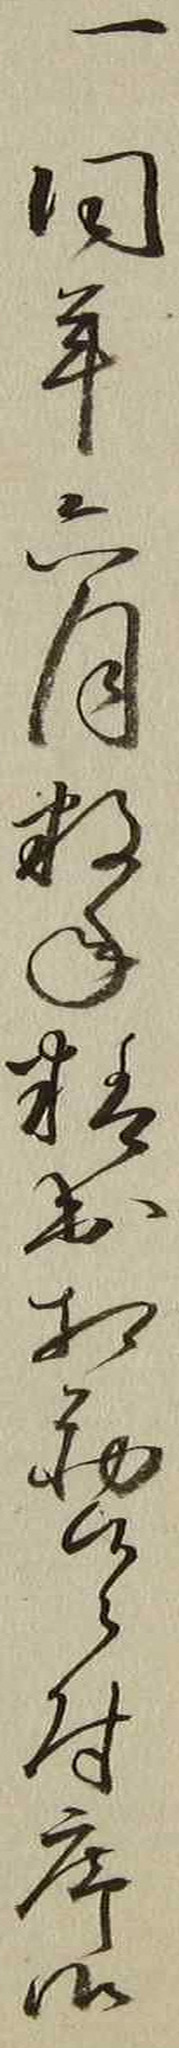一同年六月数年精出相勤候ニ付席御
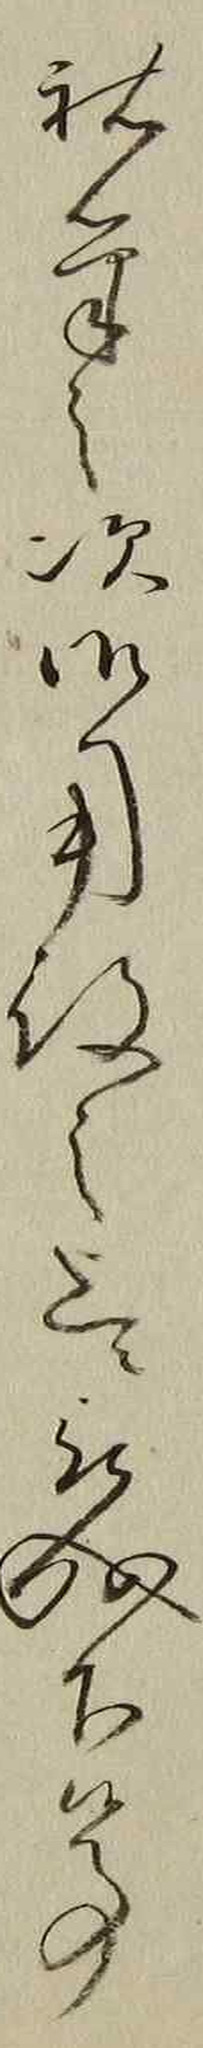祐筆之次御用役之上ニ被成下候事
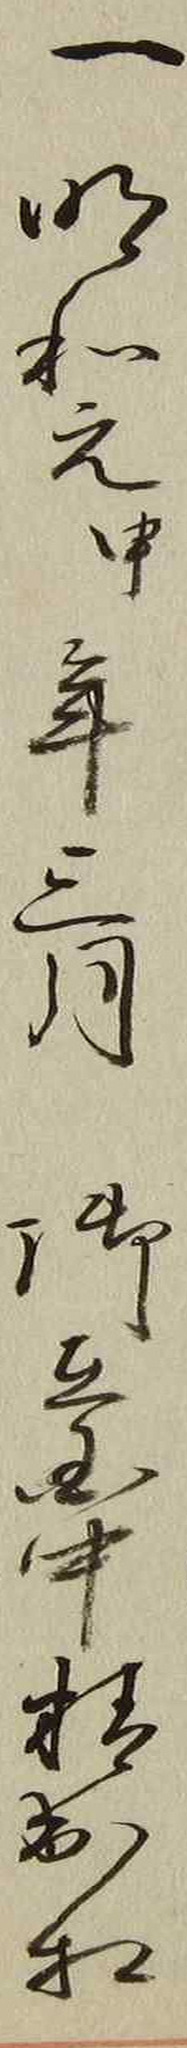一明和元申年三月御在国中精出相
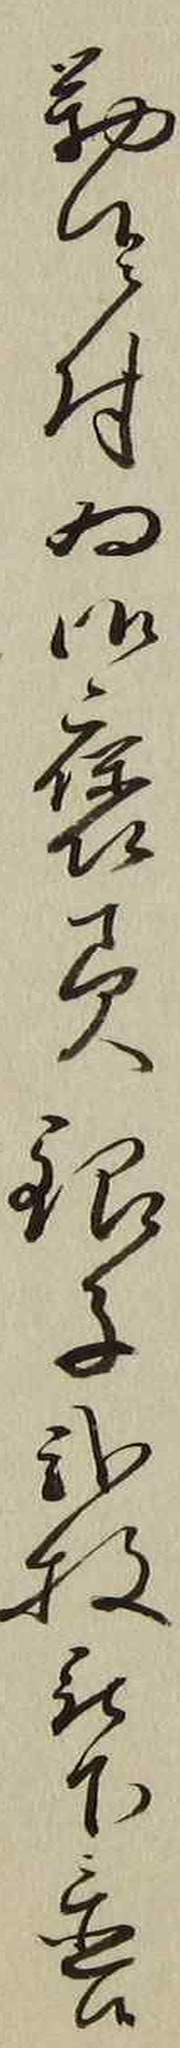勤候ニ付為御褒美銀子弐枚被下置候
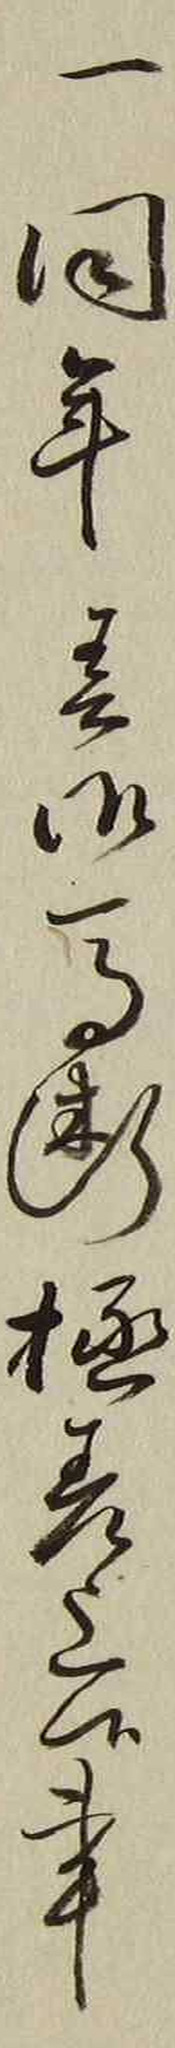一同年春御馬術極差上候事
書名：諸士系譜　巻之3　い之部3
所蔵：会津若松市立会津図書館
